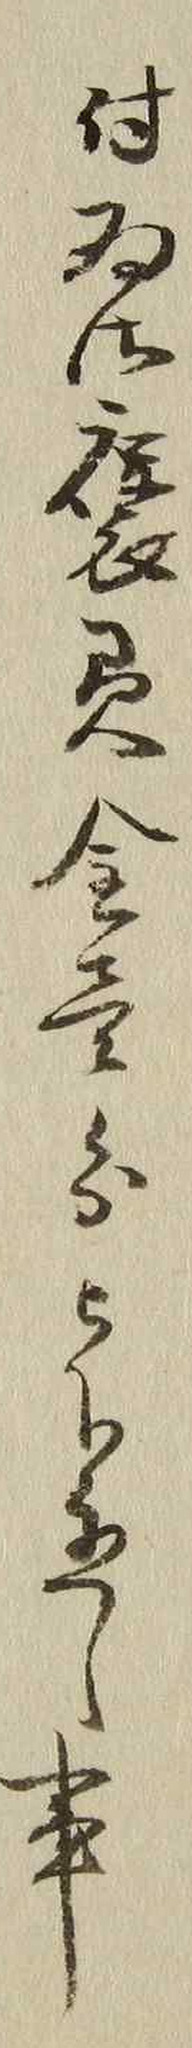付為御褒美金壱分被下置候事
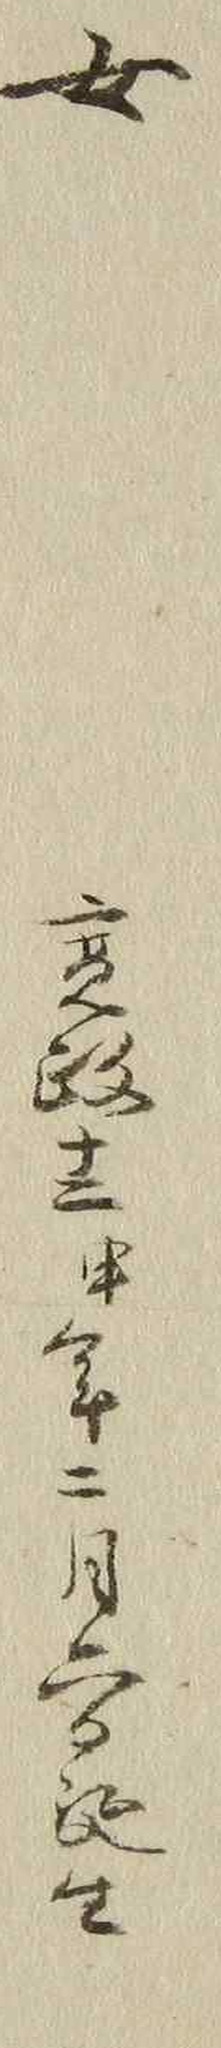女寛政十二申年二月六日誕生
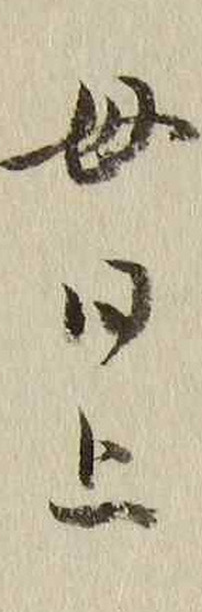母同上

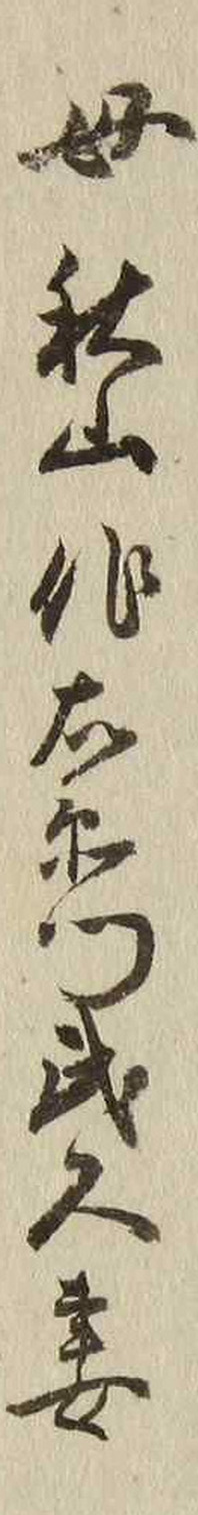母秋山作右衛門武久妻
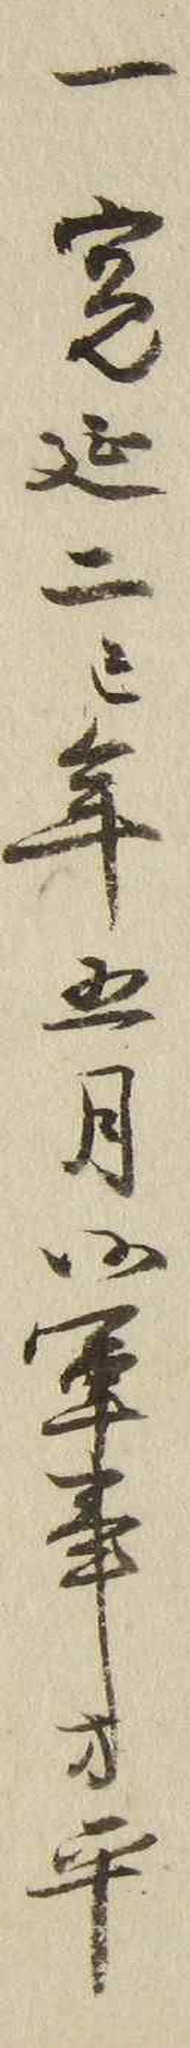一寛延二巳年五月御軍事方平

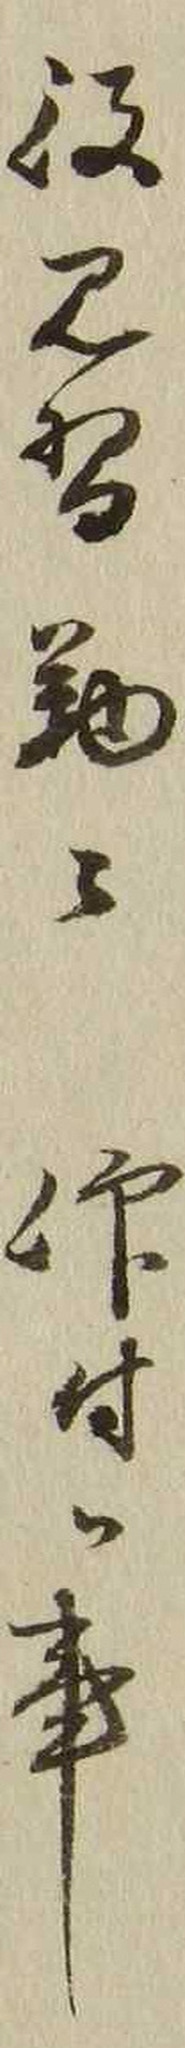役見習勤被仰付候事
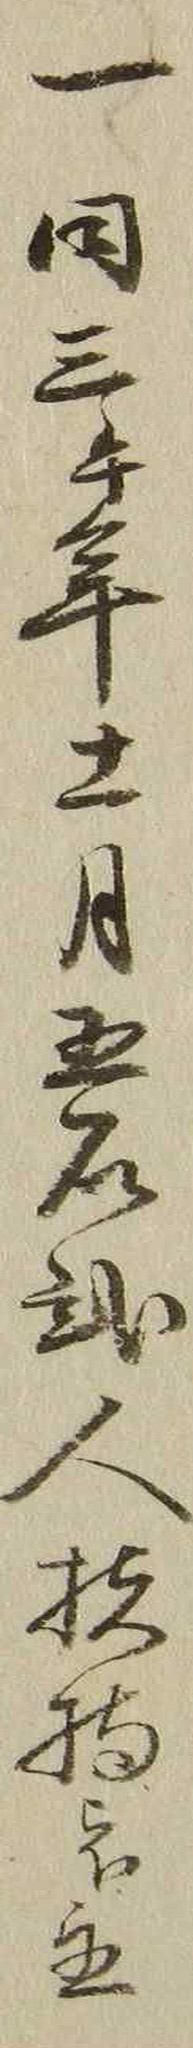一同三午年十一月五石弐人扶持被下置
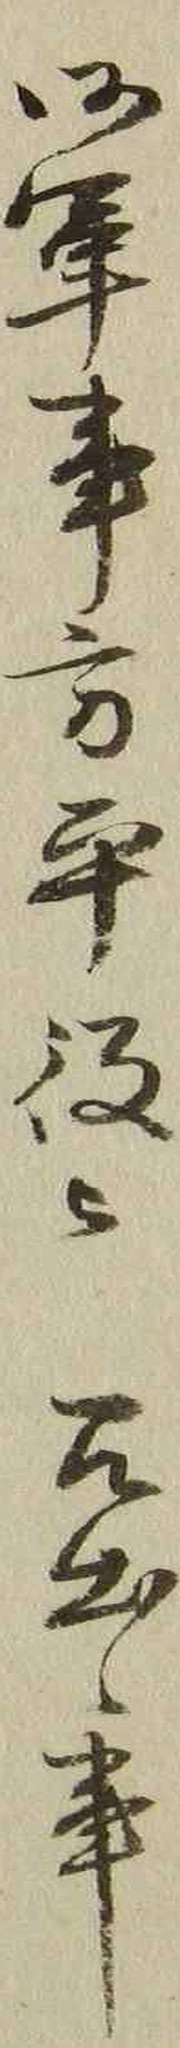御軍事方平役被召出候事
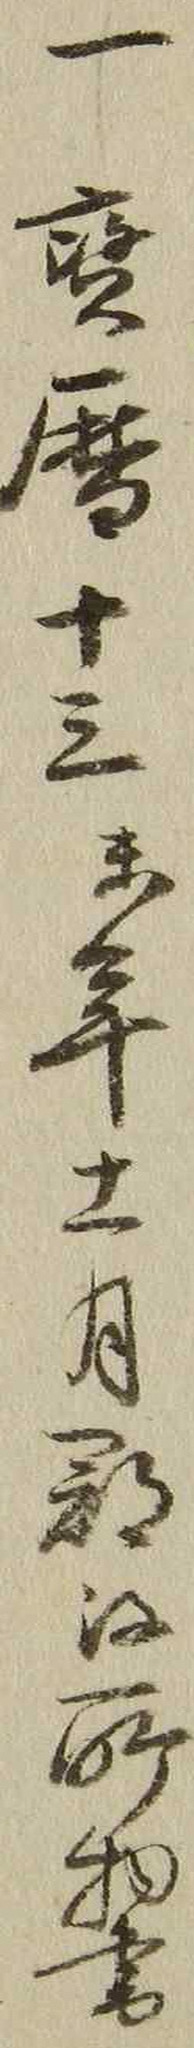一宝暦十三未年十一月郡役所物書
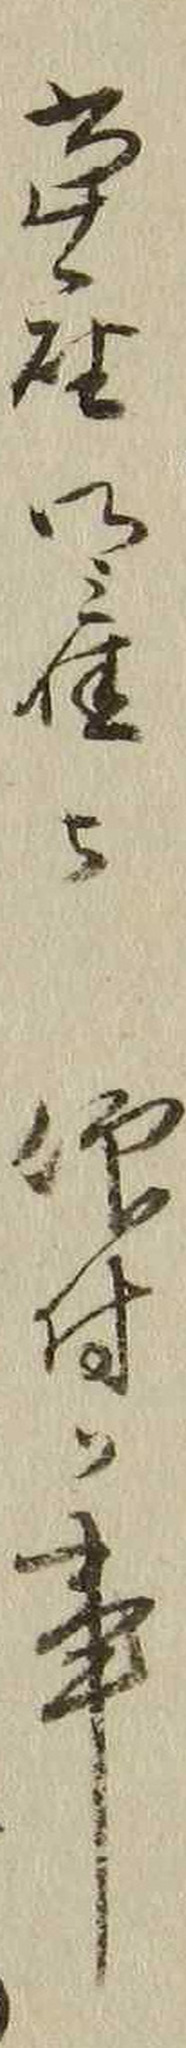当座御雇被仰付候事
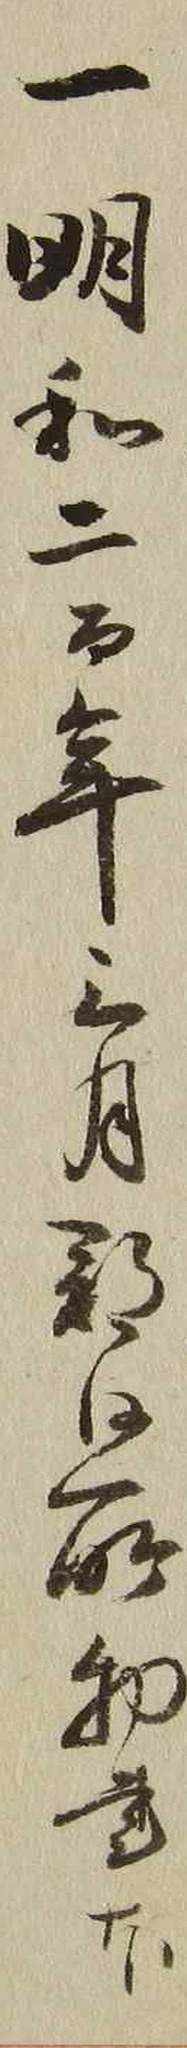一明和二酉年三月郡役所物書本
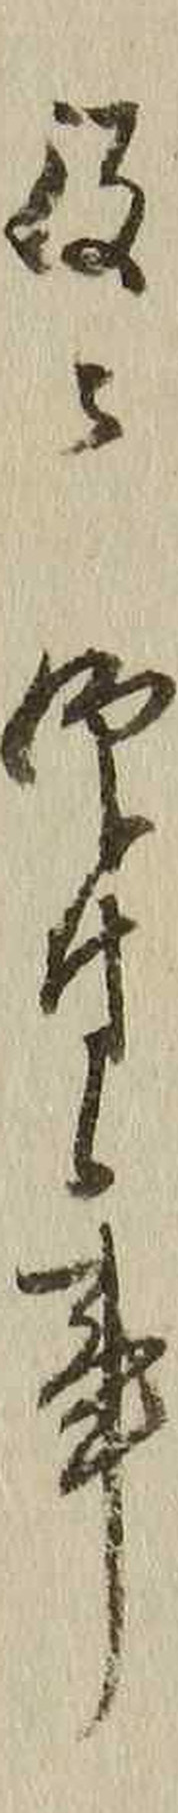役被仰付候事
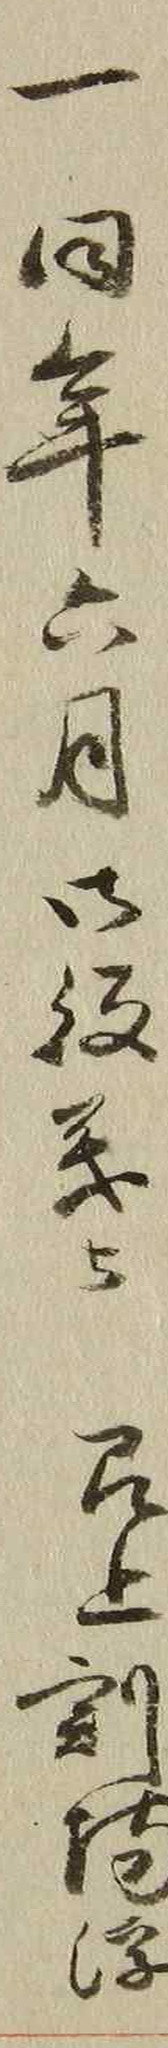一同年六月御役義被召上割場浮
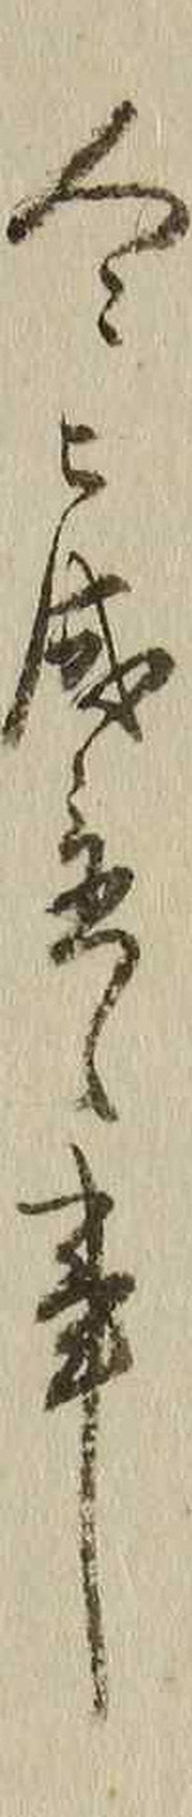人ニ被成置候事
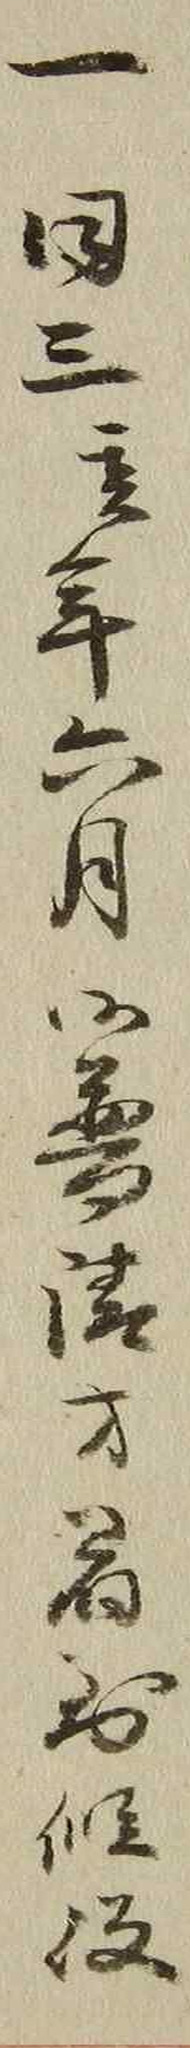一同三亥年六月御普請方着到仮役
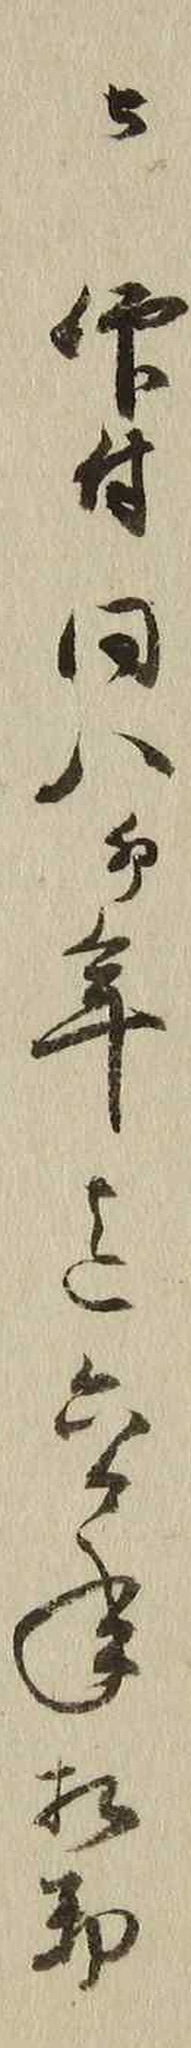被仰付同八卯年迄六ヶ年相勤
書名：諸士系譜　巻之236　ふ之部4
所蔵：会津若松市立会津図書館
